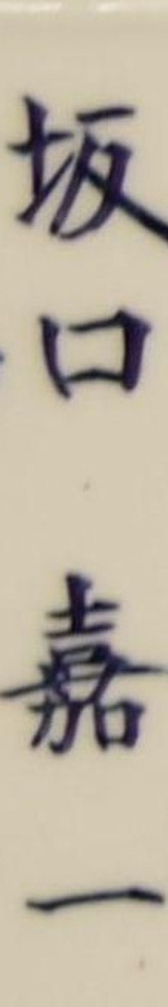坂口嘉一
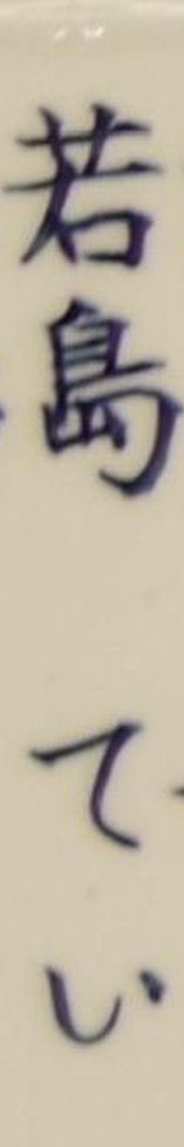若島てい
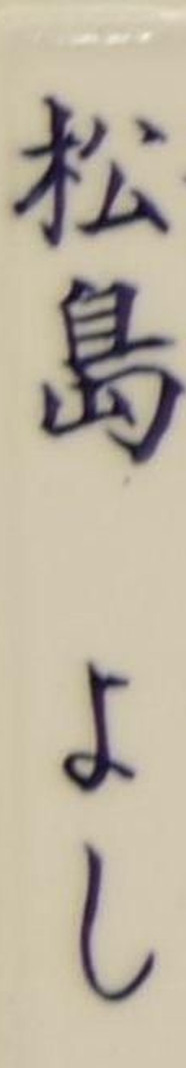松島よし

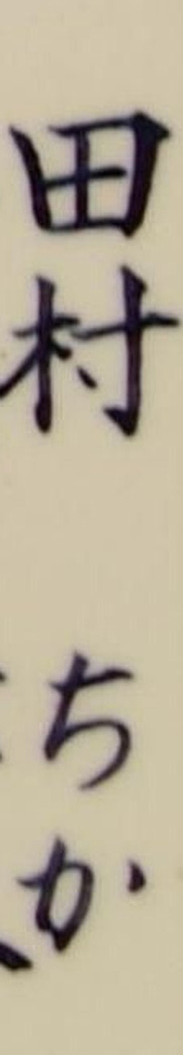田村ちか
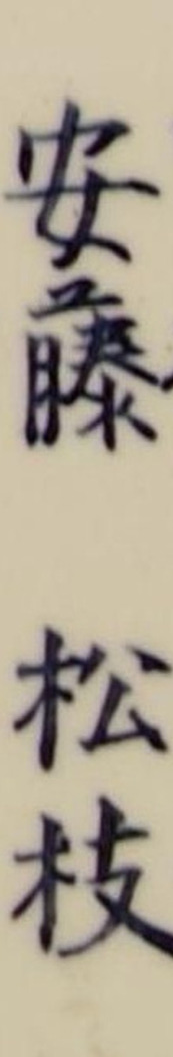安藤松枝
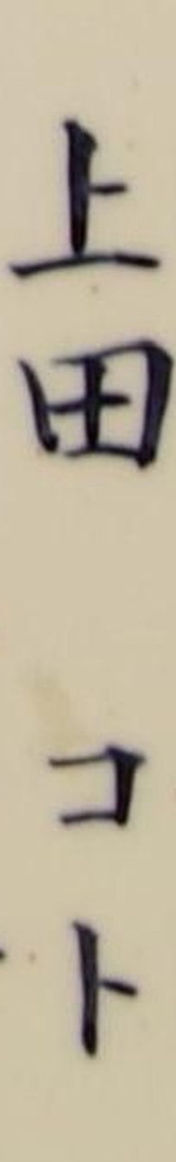上田コト
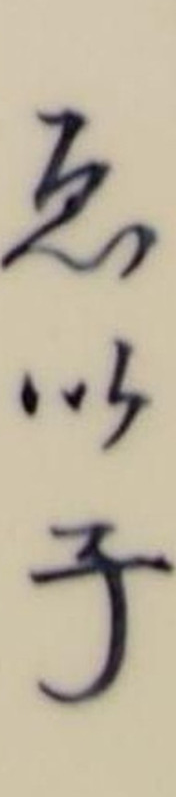ゑい子
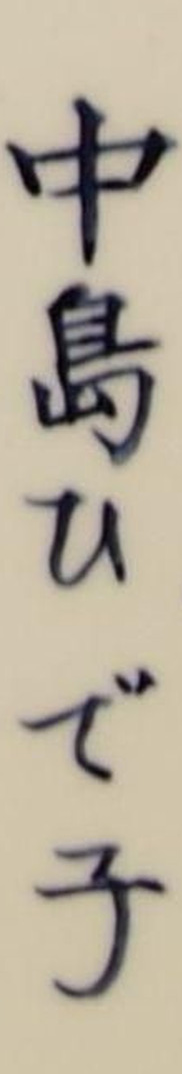中島ひで子
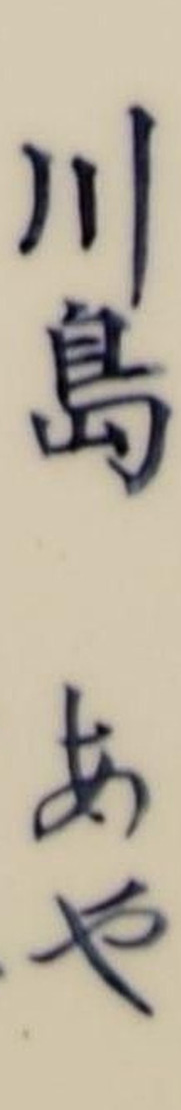川島あや
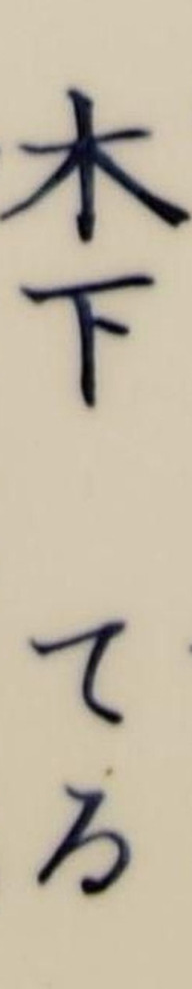木下てる
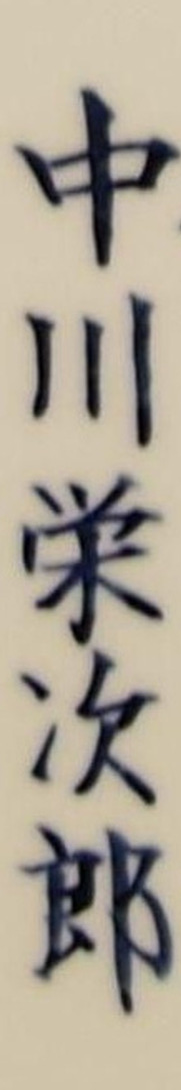中川栄次郎
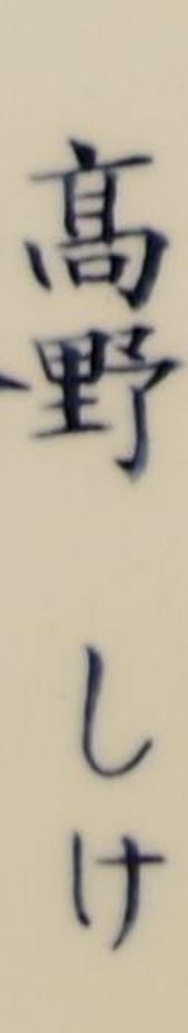高野しけ
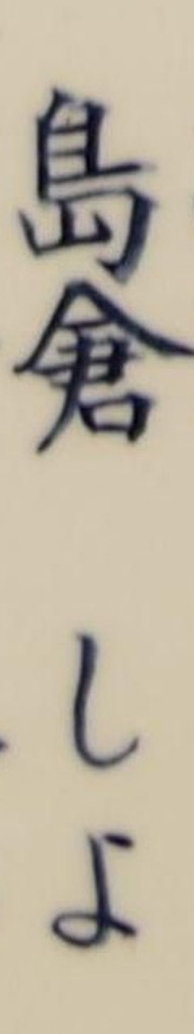島倉しよ
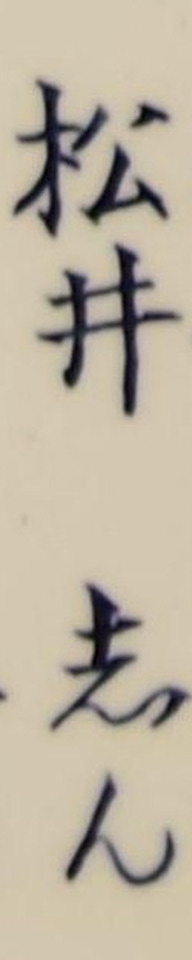松井しん
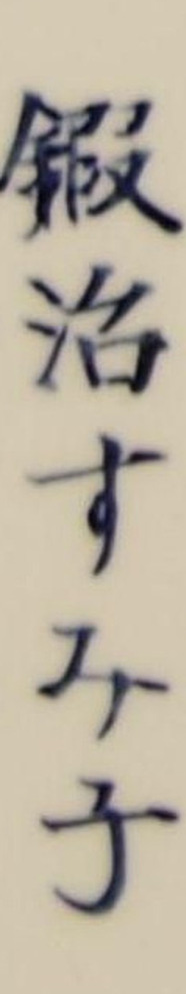鍛治すみ子
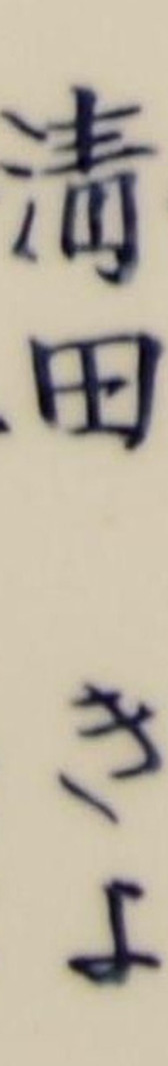清田きよ
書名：A~D
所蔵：koyasan kongobuji
